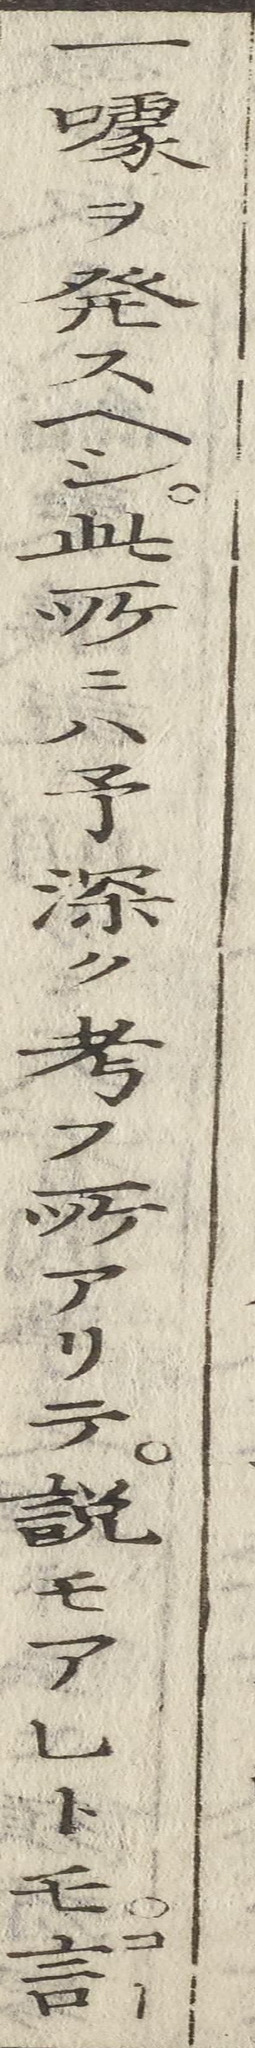一啄ヲ発スヘシ。此所ニハ予深ク考フ所アリテ。説モアレモ。言
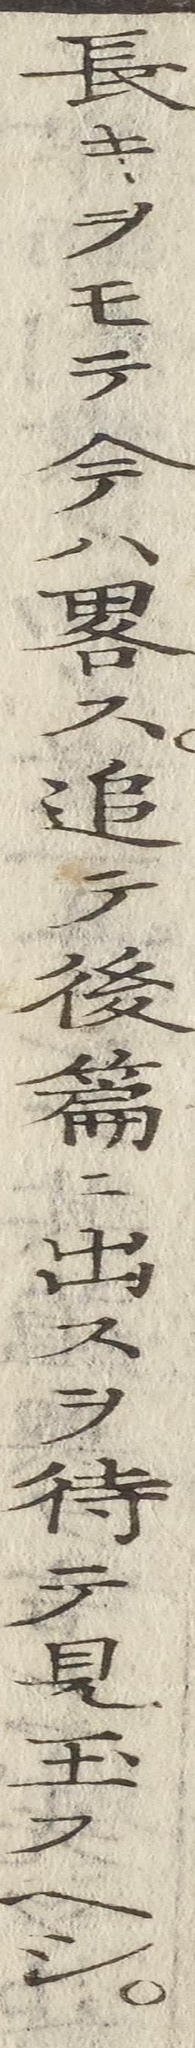長キヲモテ今ハ略ス。追テ後篇ニ出スヲ待テ見玉フヘシ。
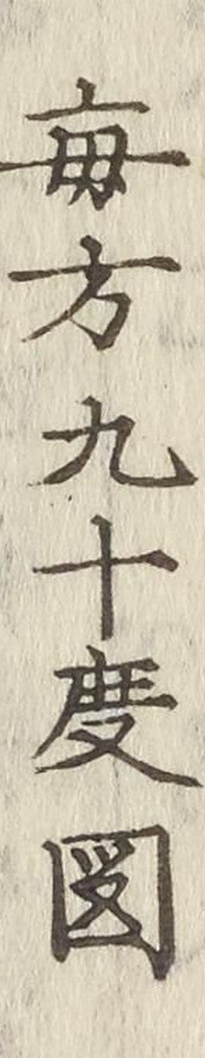毎方九十度図

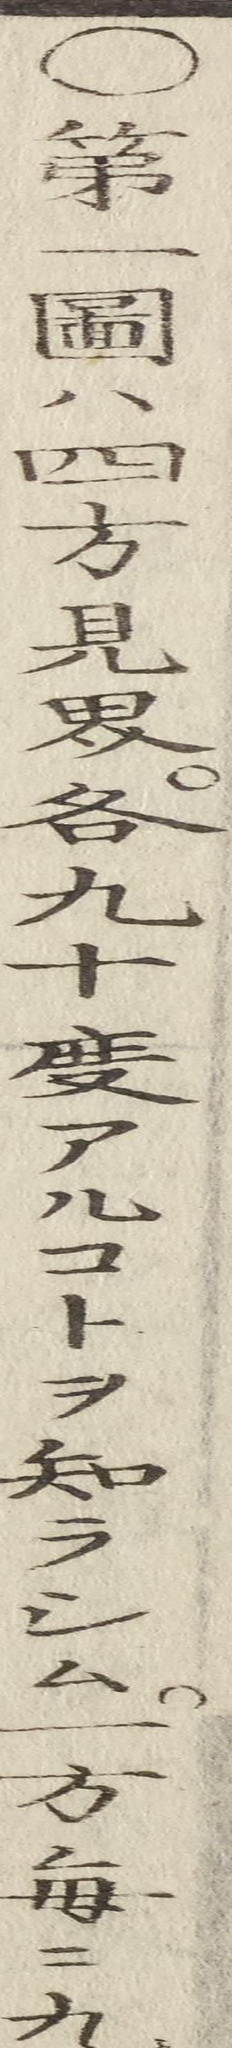○第一図ハ四方見界。各九十度アルコトヲ知ラシム。一方毎ニ九
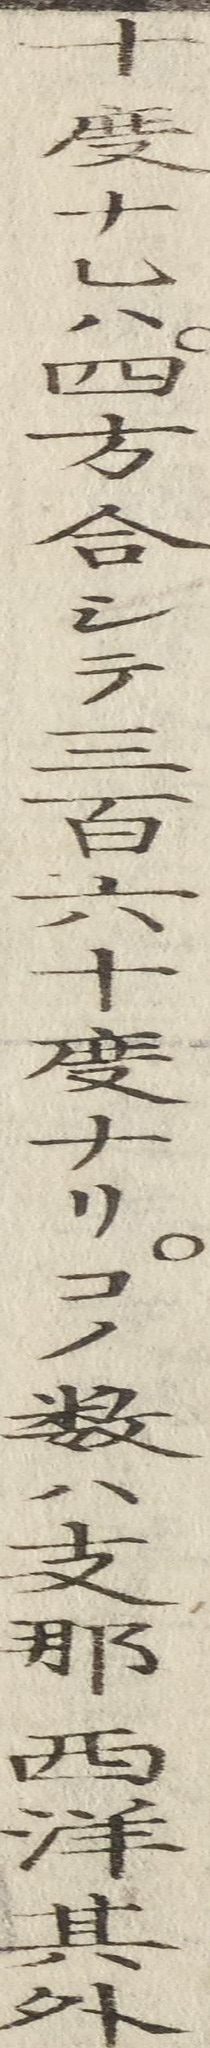十度ナレハ。四方合シテ三百六十度ナリ。コノ数ハ支那西洋其外
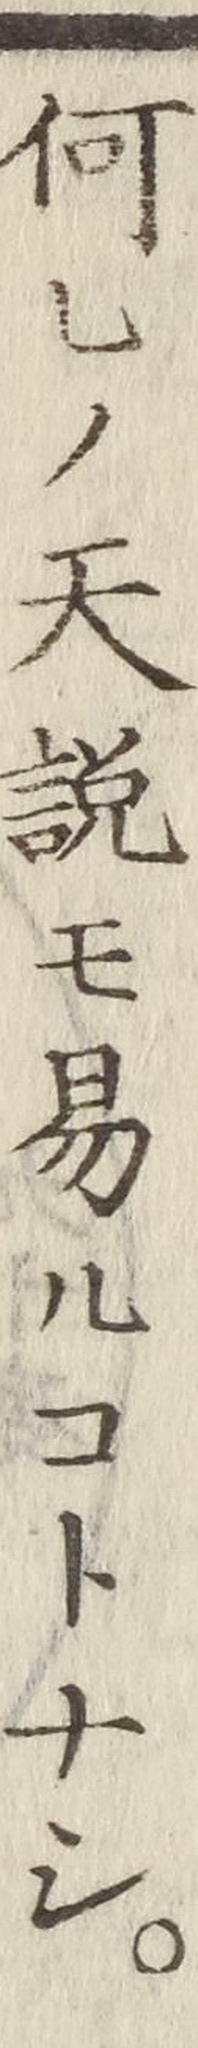何レノ天説モ易ルコトナシ。
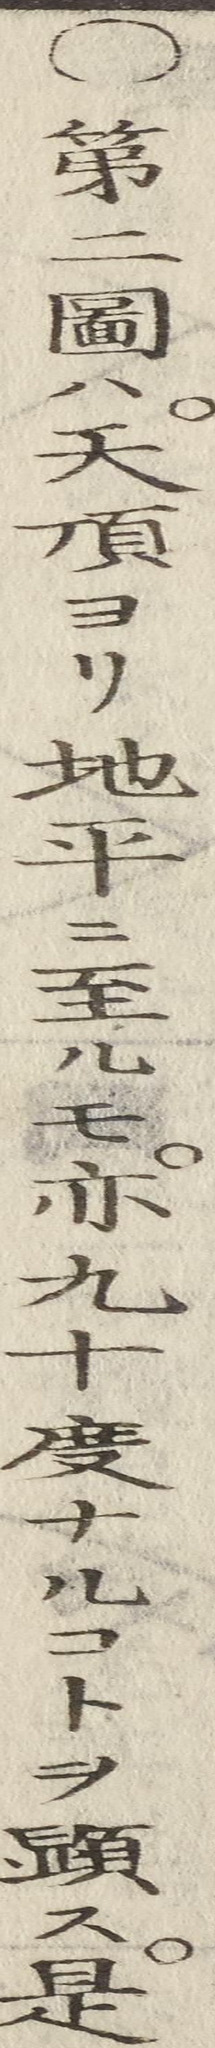○第二図ハ。天頂ヨリ地平ニ至ルモ。亦九十度ナルコトヲ顕ス。是
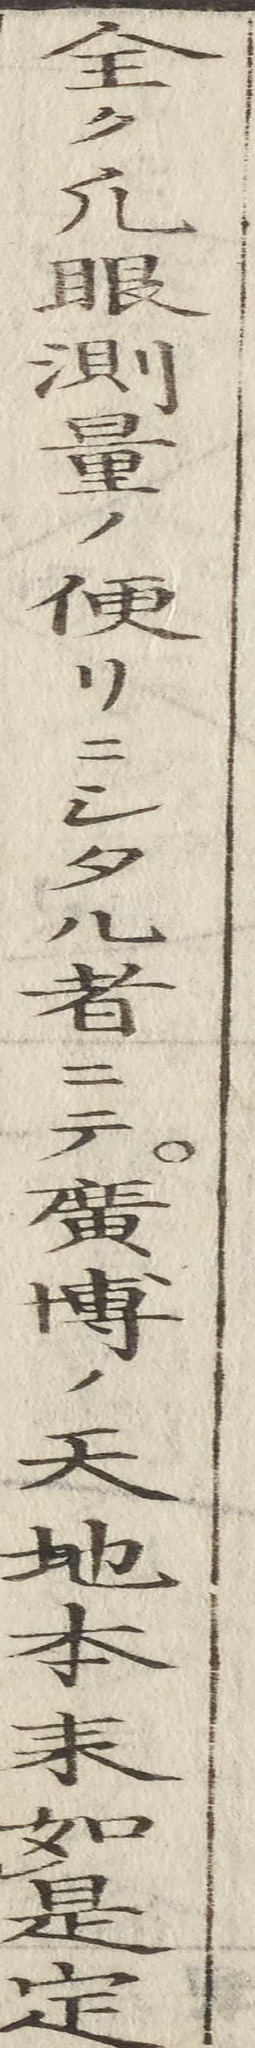全ク凡眼測量ノ便リニシタル者ニテ。広博ノ天地本末如是定
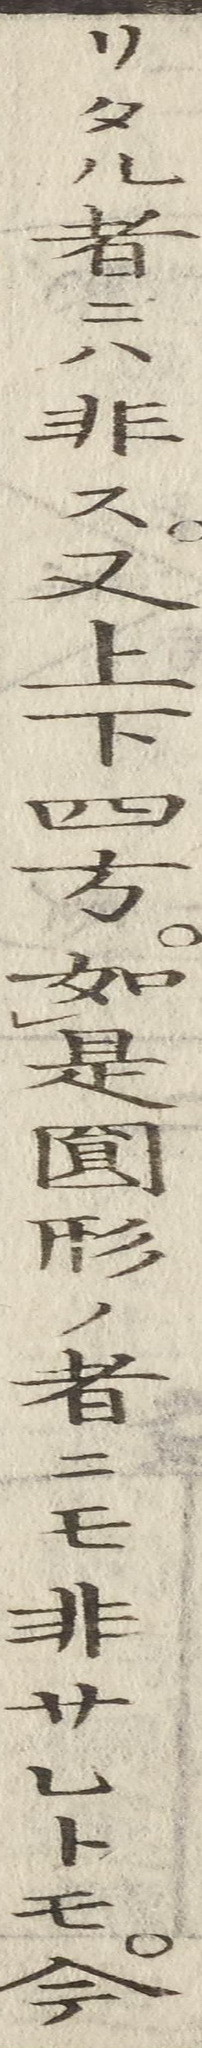リタル者ニハ非ス。又上下四方。如是円形ノ者ニモ非サレトモ。今
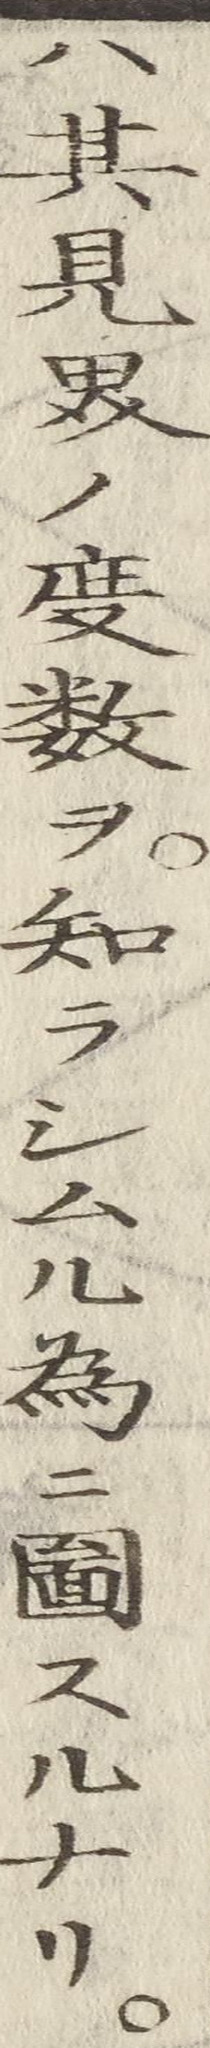ハ其見界ノ度数ヲ。知ラシムル為ニ図スルナリ。
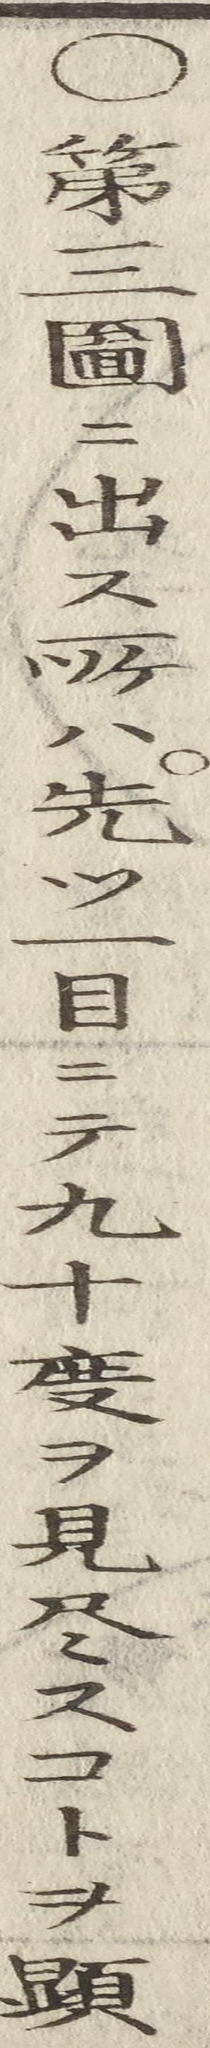○第三図ニ出ス所ハ。先ツ一目ニテ九十度ヲ見尽スコトヲ顯
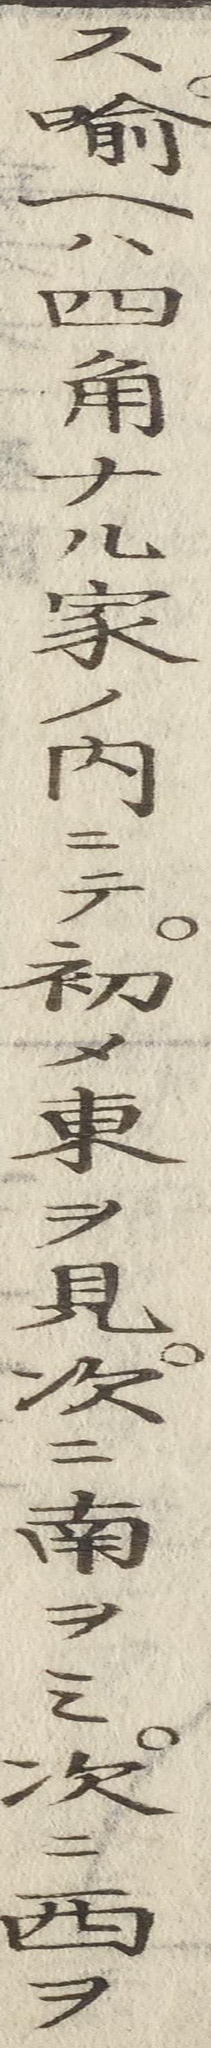ス。喩ヘハ四角ナル家ノ内ニテ。初メ東ヲ見。次ニ南ヲミ。次ニ西ヲ
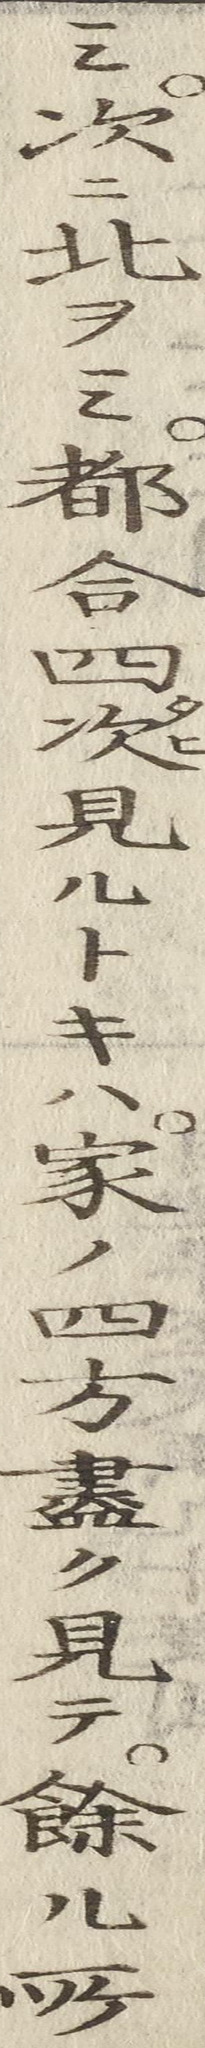ミ。次ニ北ヲミ。都合四次見ルトキハ。家ノ四方尽ク見テ。余ル所
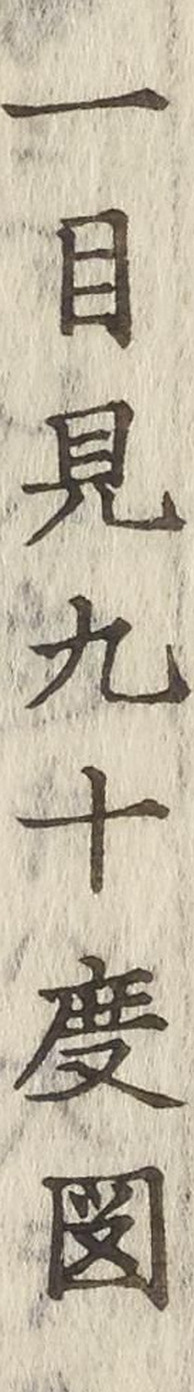一目見九十度図
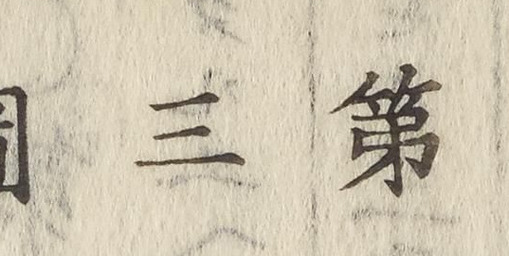第三図
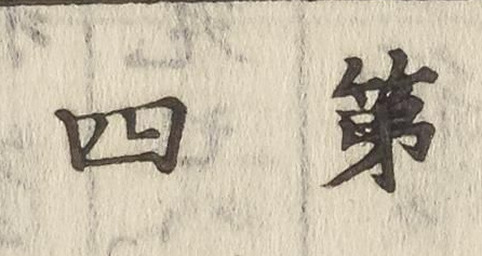第四図
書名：護法新論　上
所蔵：東京大学地震研究所図書室 Earthquake Research Institute Library, The University of Tokyo, JAPAN
